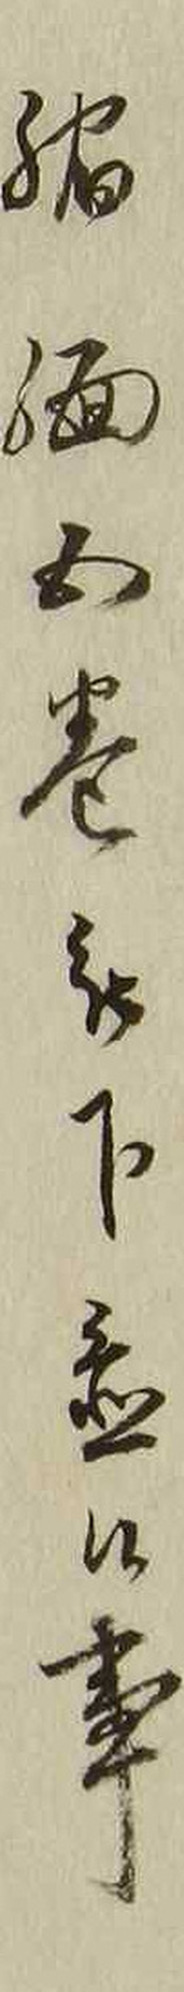縮緬五巻被下置候事
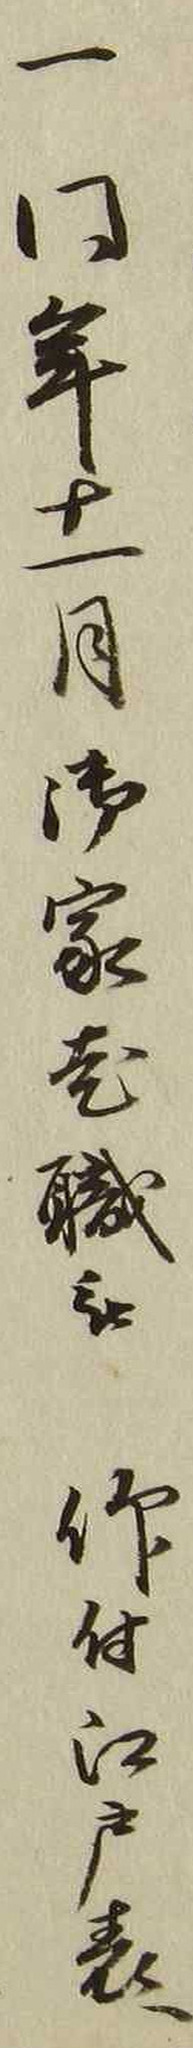一同年十一月御家老職被仰付江戸表へ
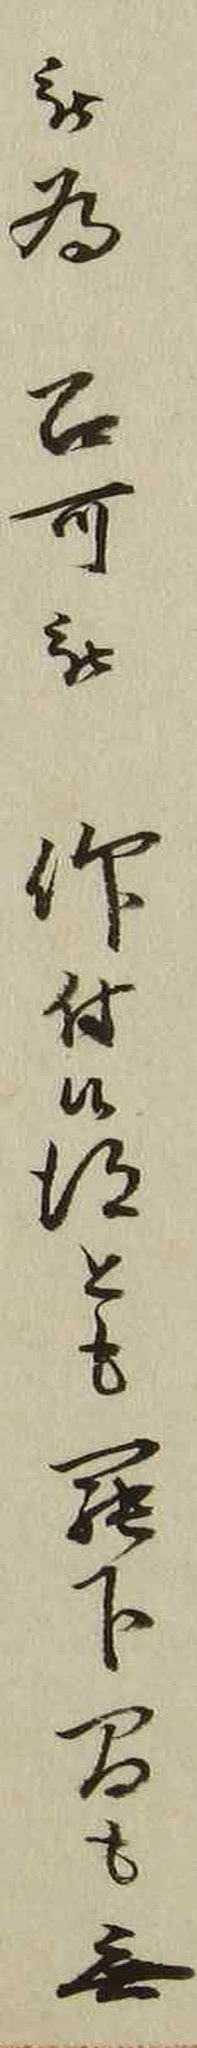被為召可被仰付候得とも罷下間も無
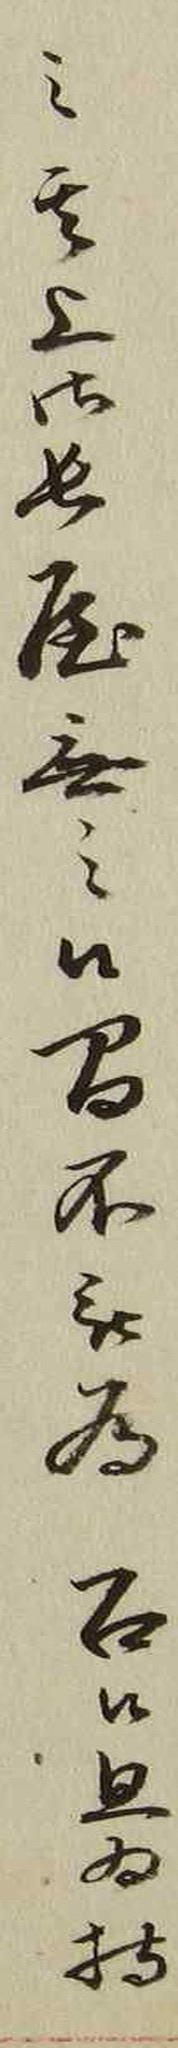之其上御長屋無之候間不被為召候且為持
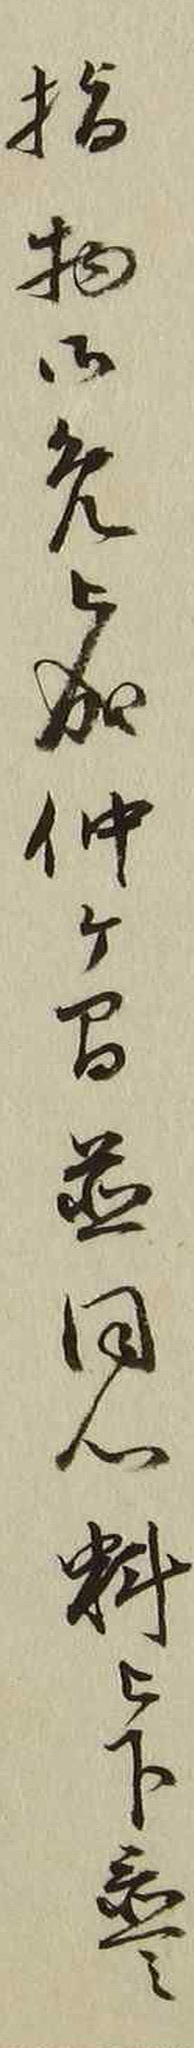指物御免被成仲ヶ間並同心料被下置之
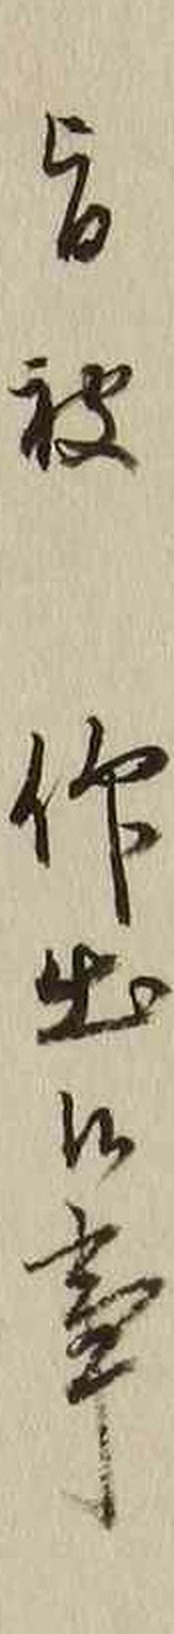旨被仰出候事
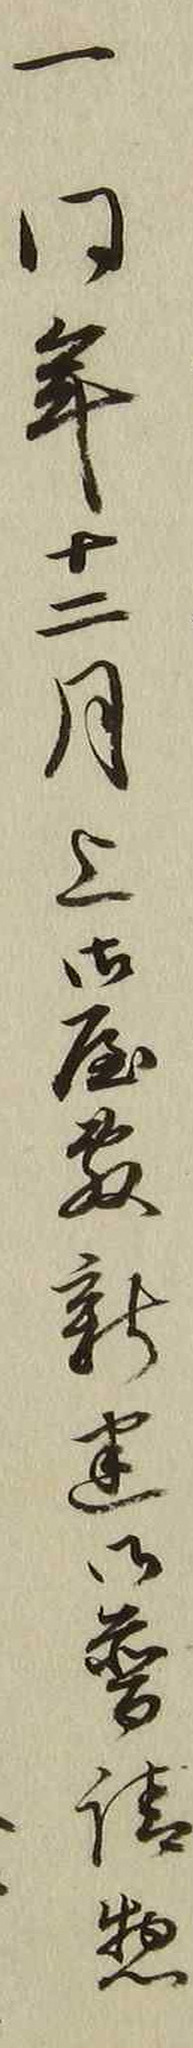一同年十二月上御屋敷新建御普請惣
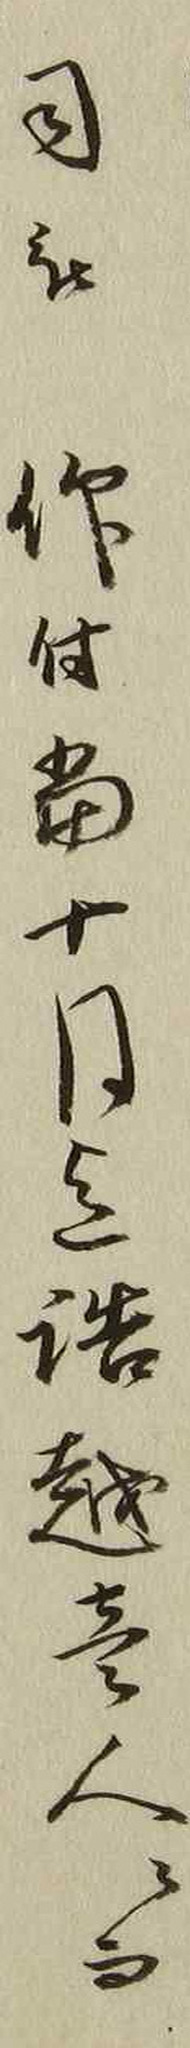司被仰付当十月迄詰越壱人に而
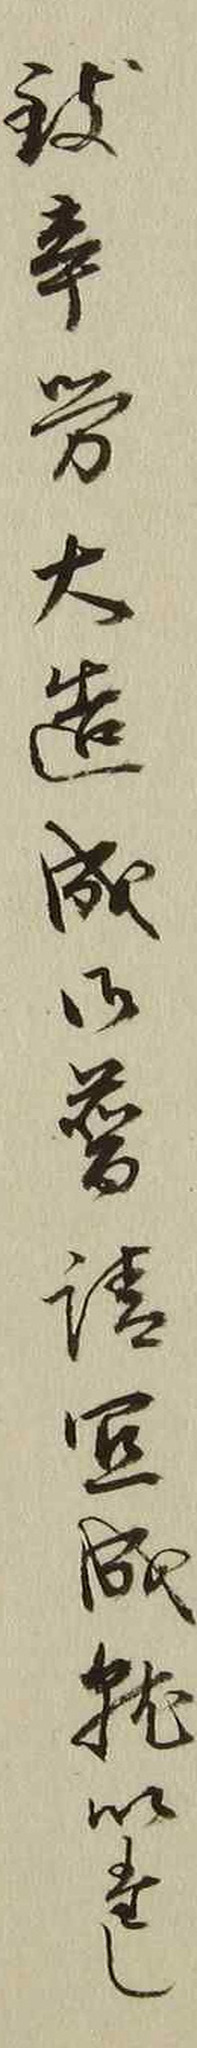致辛労大造成御普請宜成就いたし
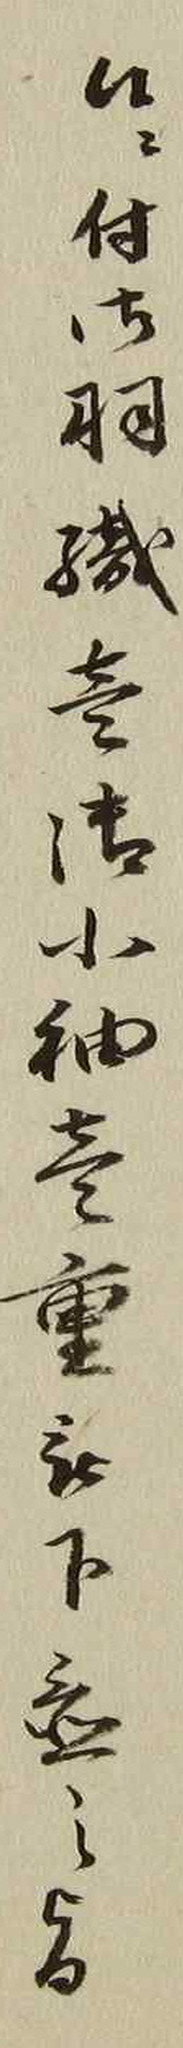候に付御羽織壱御小袖壱重被下之置之旨
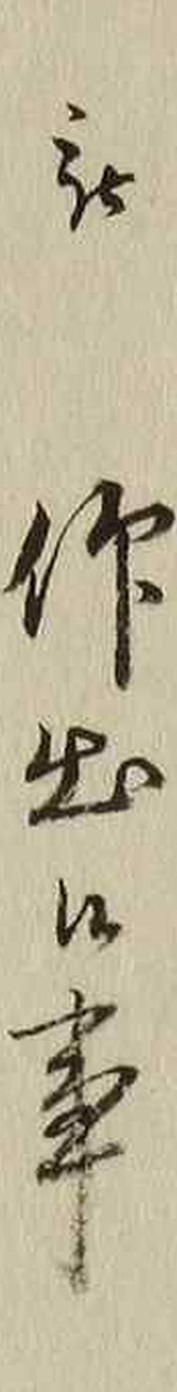被仰出候事
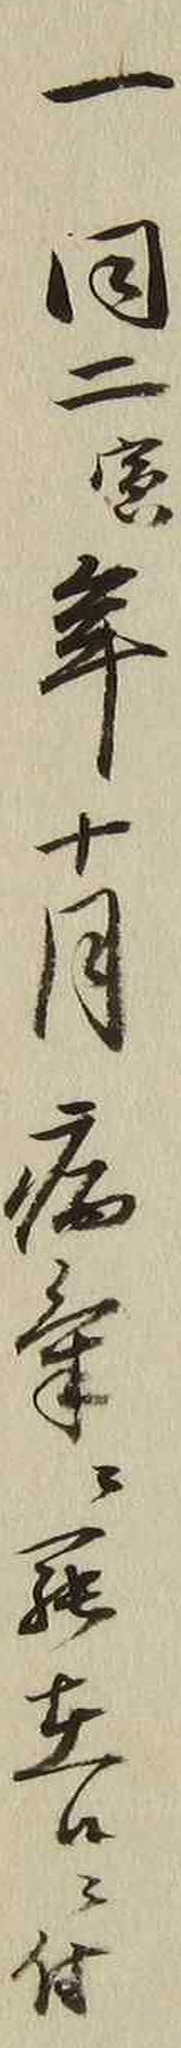一同二寅年十月病気に罷在候に付
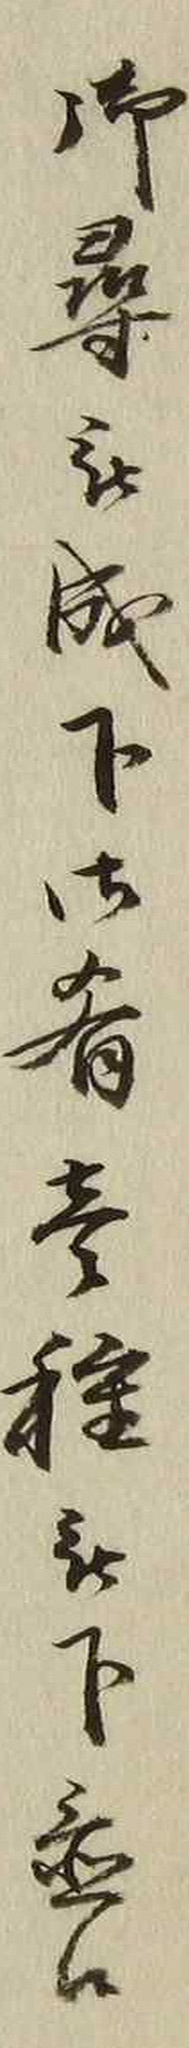御尋被成下御肴壱種被下置候
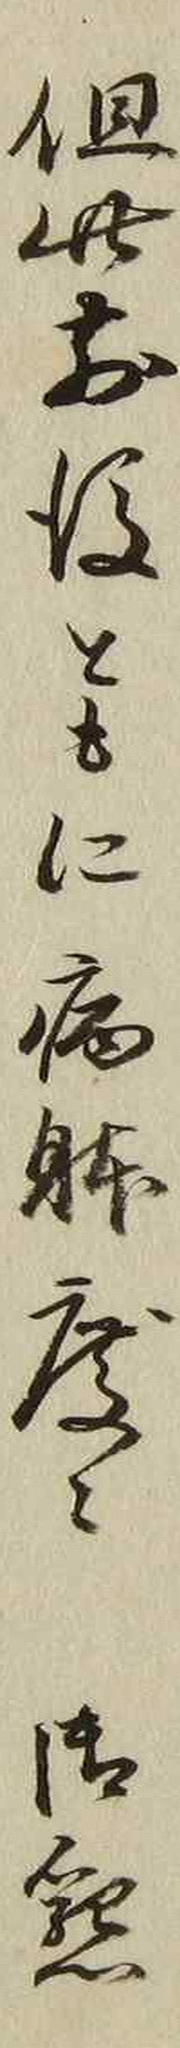但此前後ともに病体度々御懇
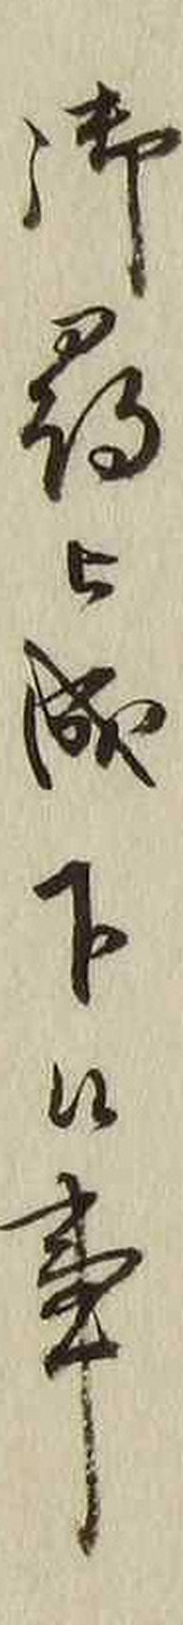之御尋被成下候事
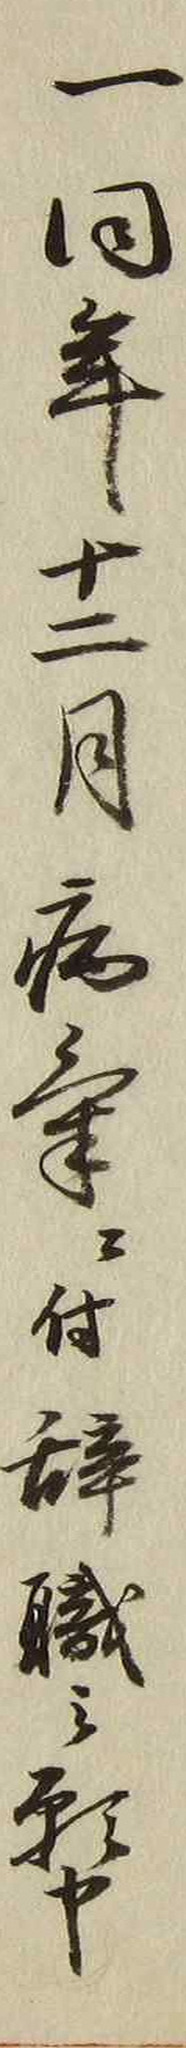一同年十二月病気に付辞職之願申
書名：諸士系譜　巻之125　た之部1
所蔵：会津若松市立会津図書館
